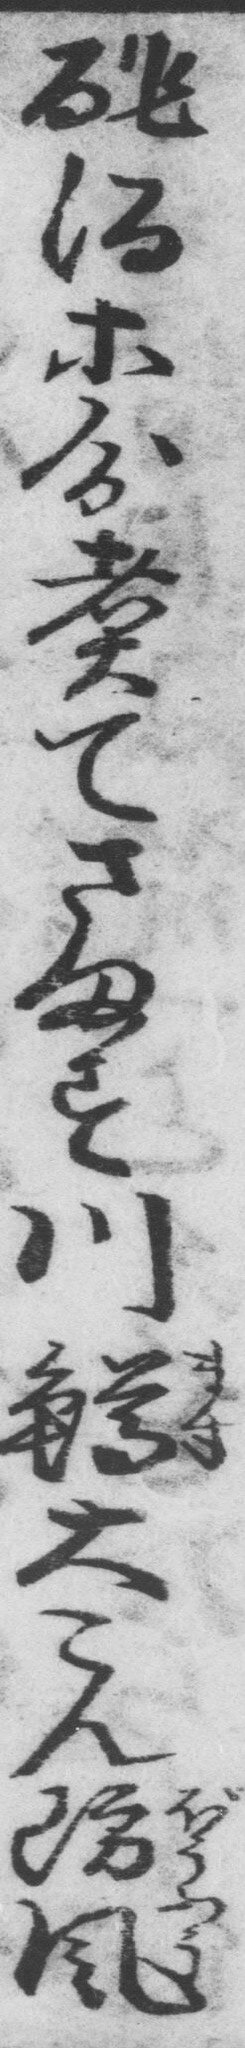酢酒等分煮てさます川鱒大こん防風
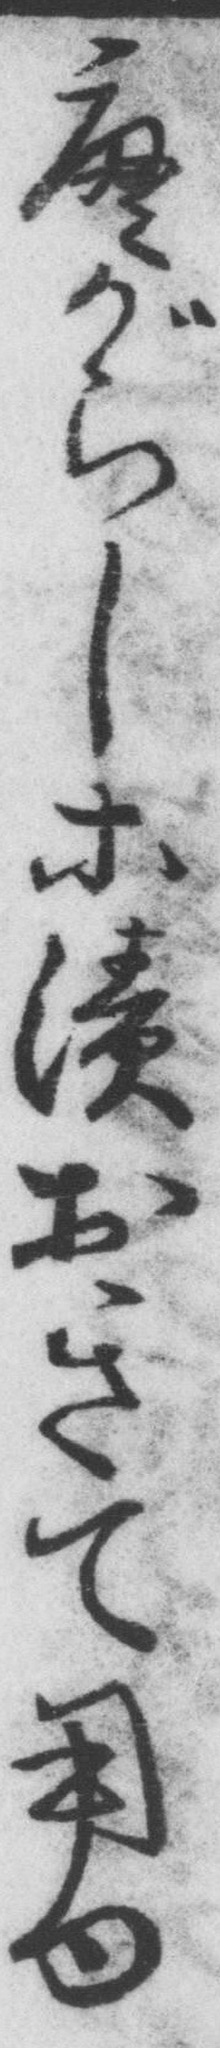唐がらし等漬おきて用ゆ
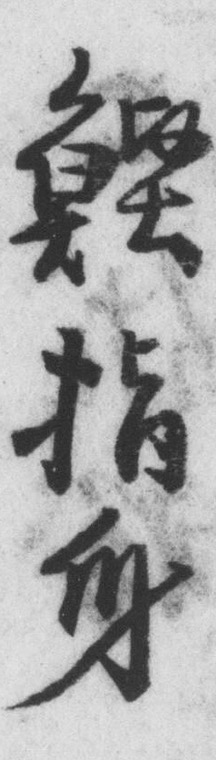鰹指身
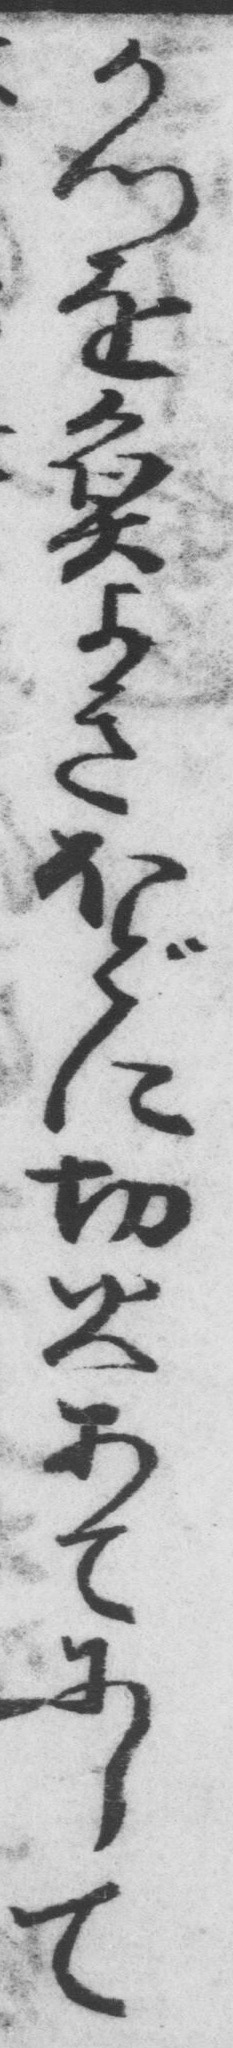かつを魚よきほどに切火あてにして
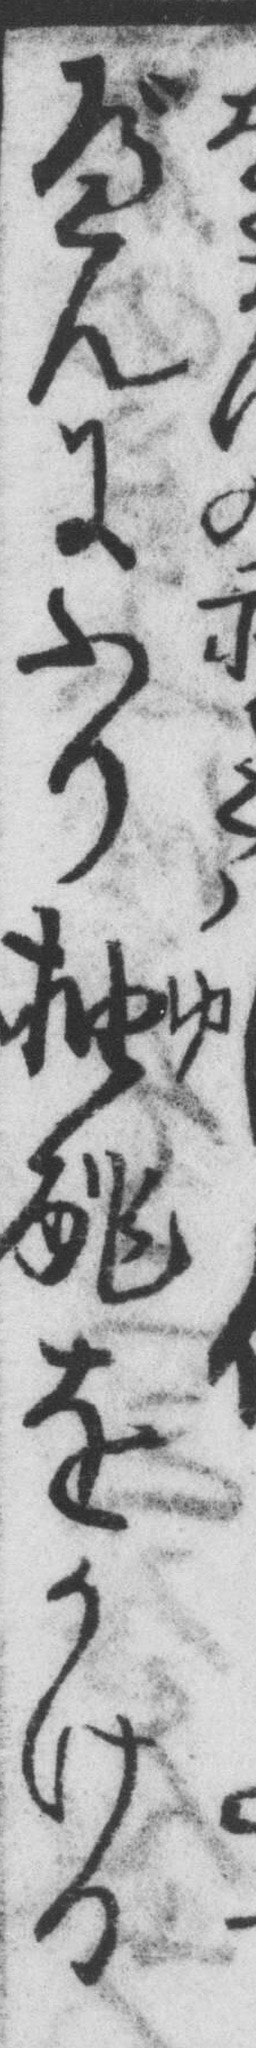べんにふり柚酢をかける
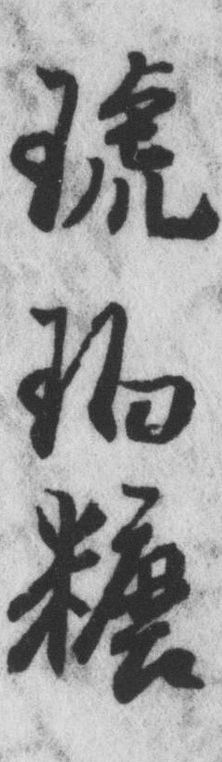琥珀糖
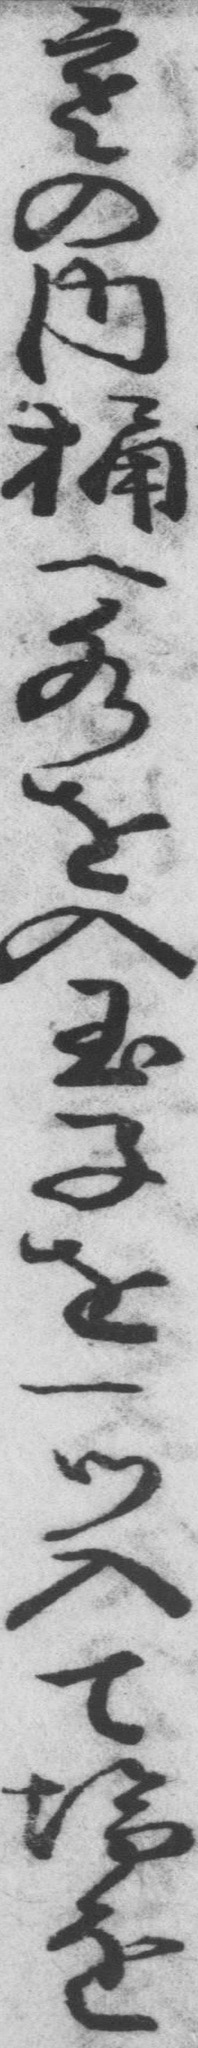寒の内桶へ水を入玉子を一ツ入て塩を
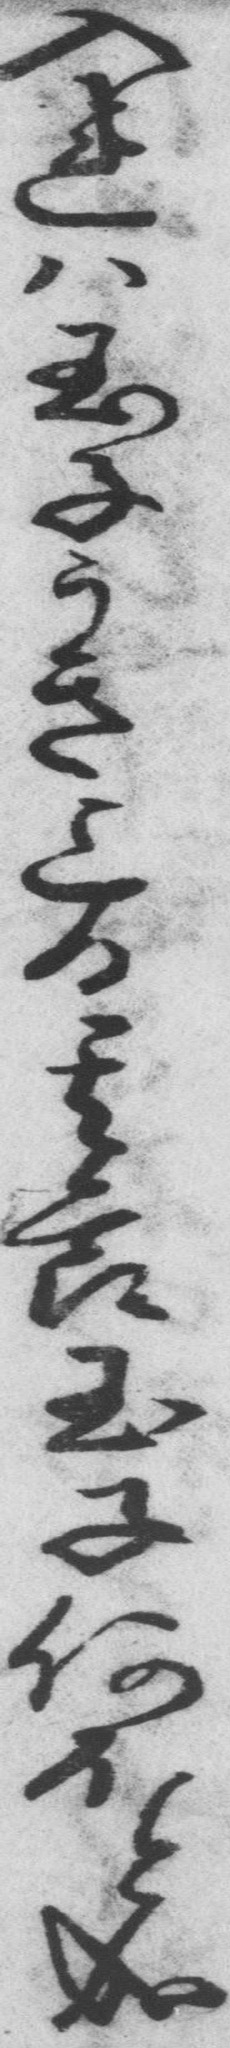入れは玉子うき上る其節玉子何ほと成
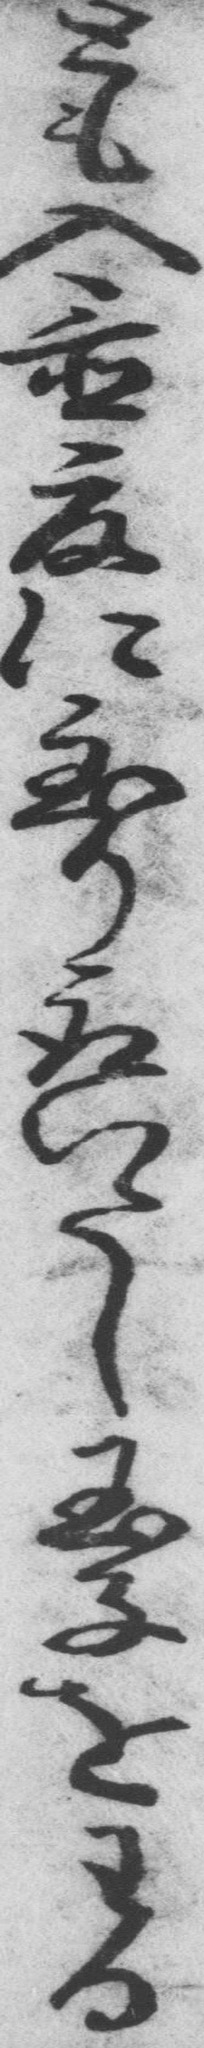とも入置夏に至り取いたし玉子をわる
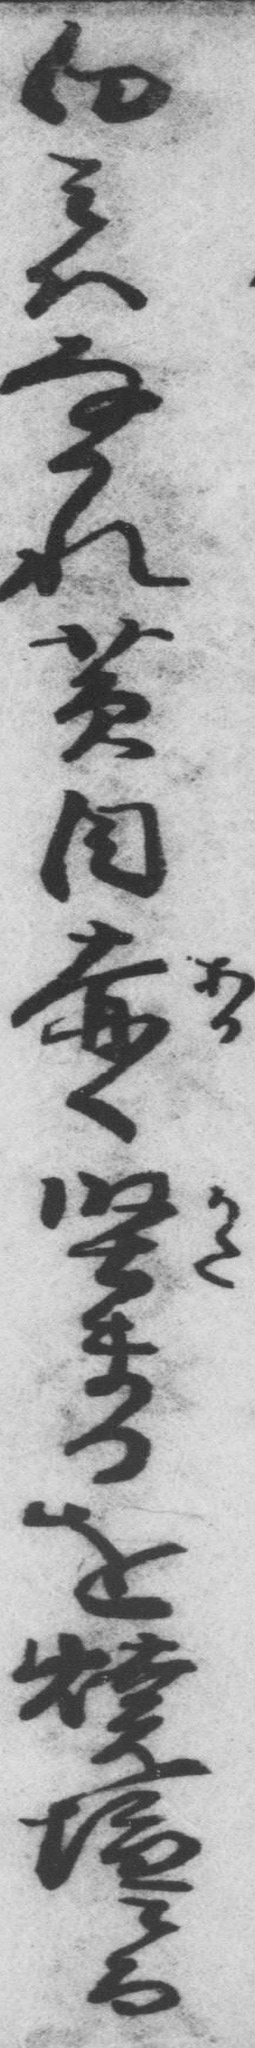白みはなかれ黄目赤く堅まるを焼塩にて
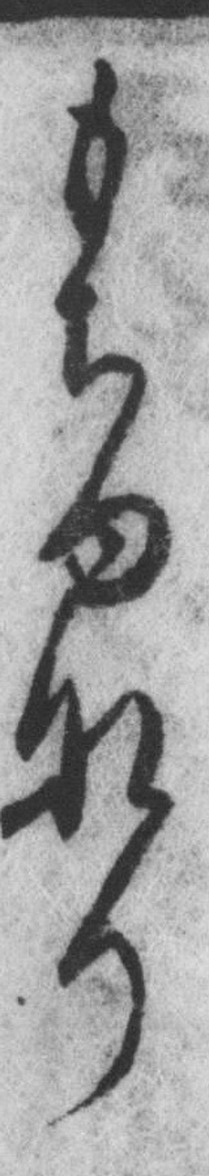もちゆなり
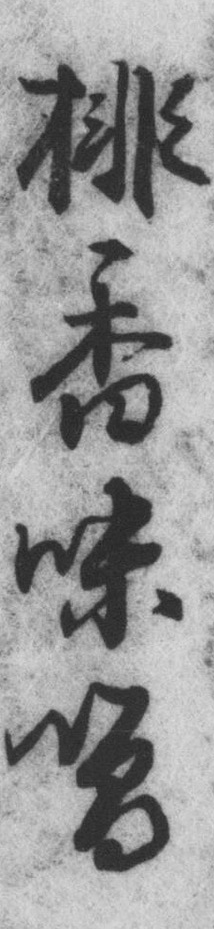桃香味噌

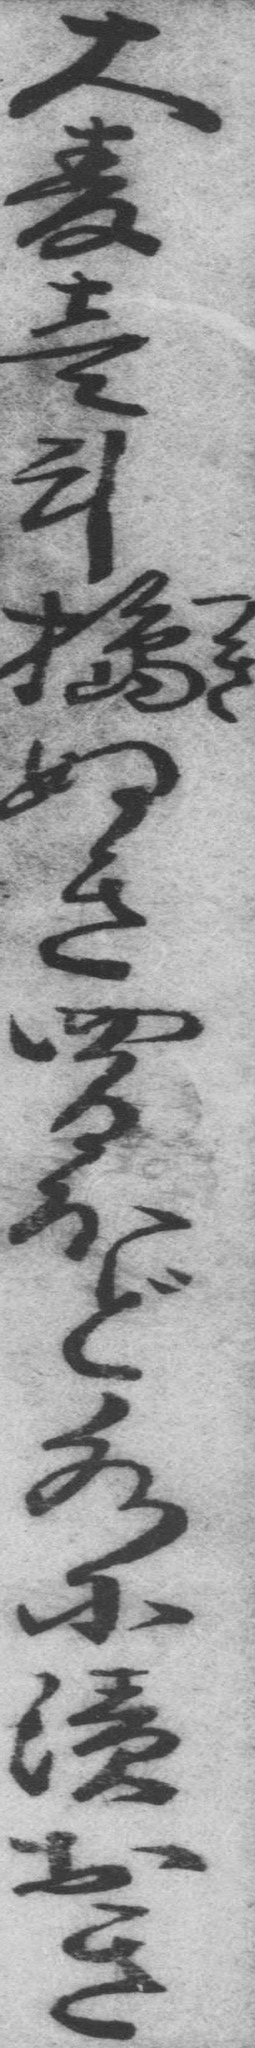大麦壱斗搗ぬき四日ほど水に漬おき
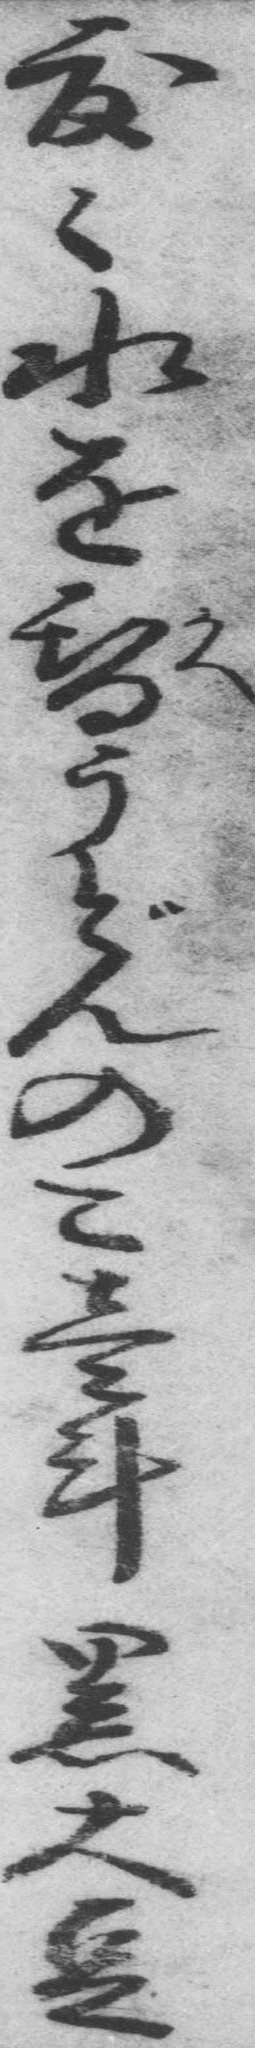度々水を替うどんのこ壱斗黒大豆
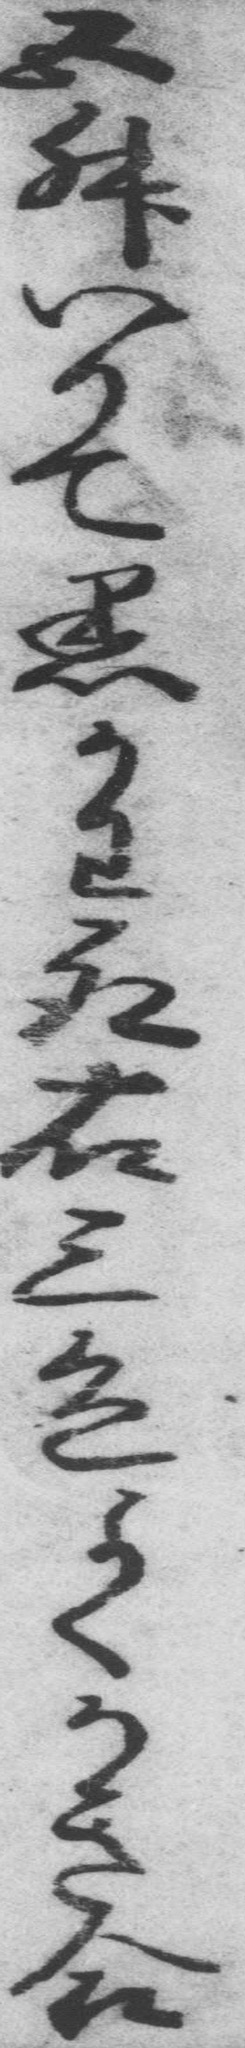五升いりて黒かわ取右三色よくかき合
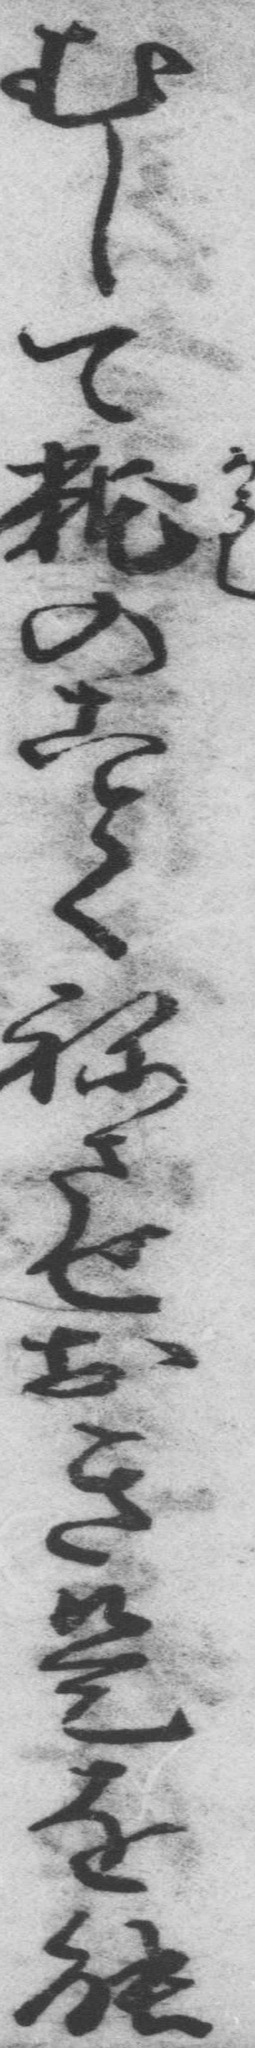むして糀のことくねさせおき是を能
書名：料理山海郷
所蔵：大阪府立大学学術情報センター 国文学研究資料館
